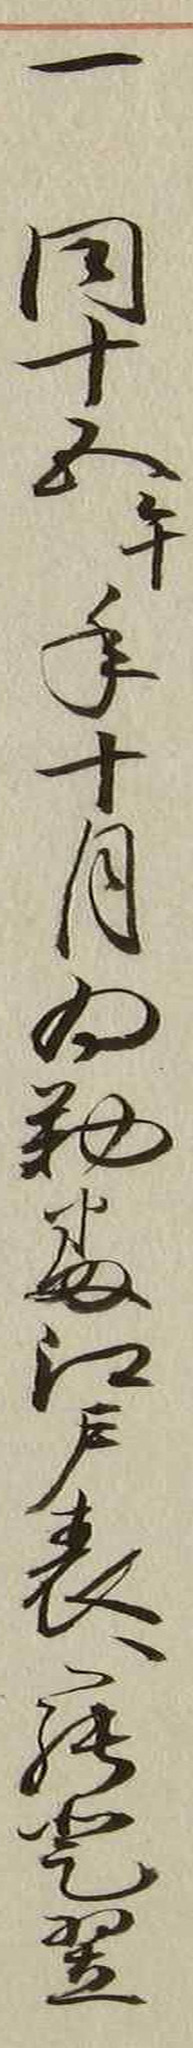一同十五午年十月為勤番江戸表へ罷登翌
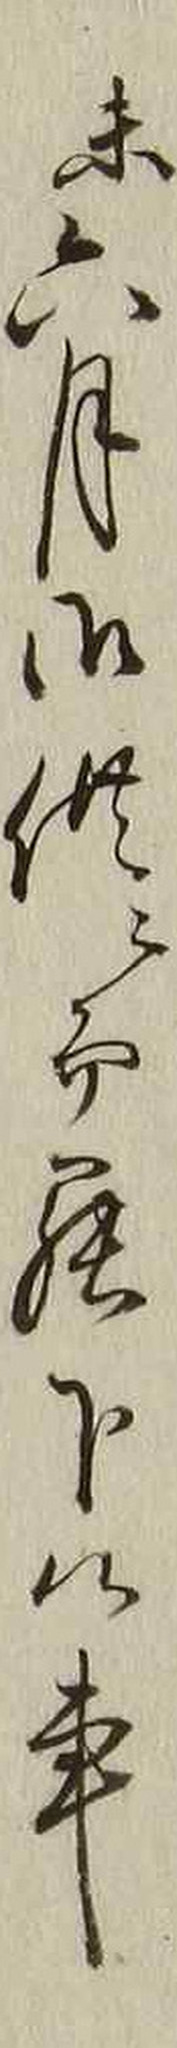未六月御供ニ而罷下候事
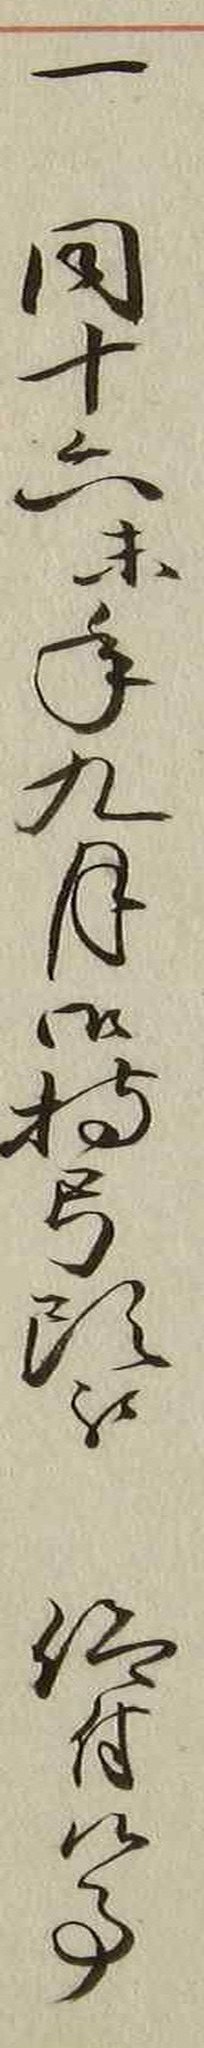一同十六未年九月御持弓頭被仰付候事
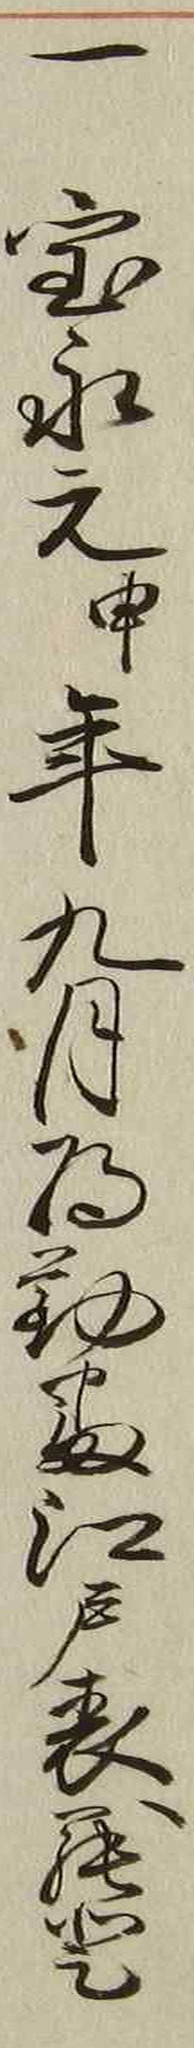一宝永元申年九月為勤番江戸表へ罷登
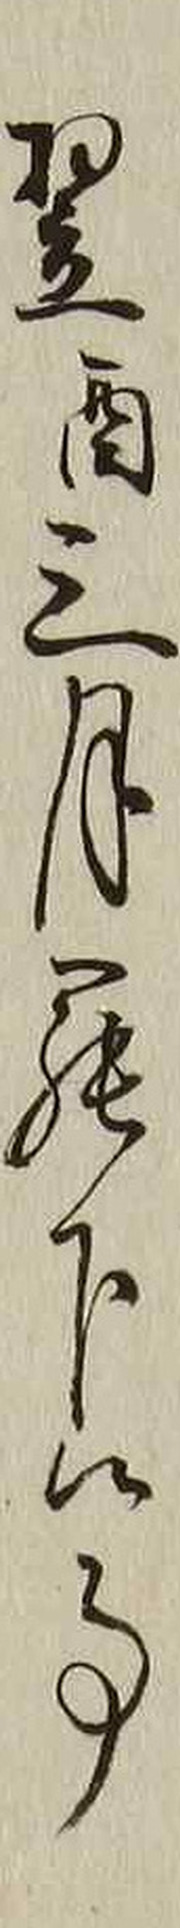翌酉三月罷下候事
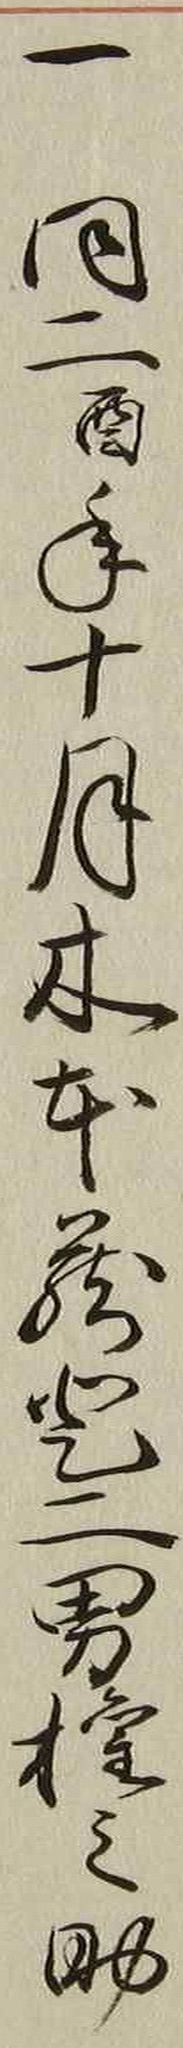一同二酉年十月木本蔵登二男権之助
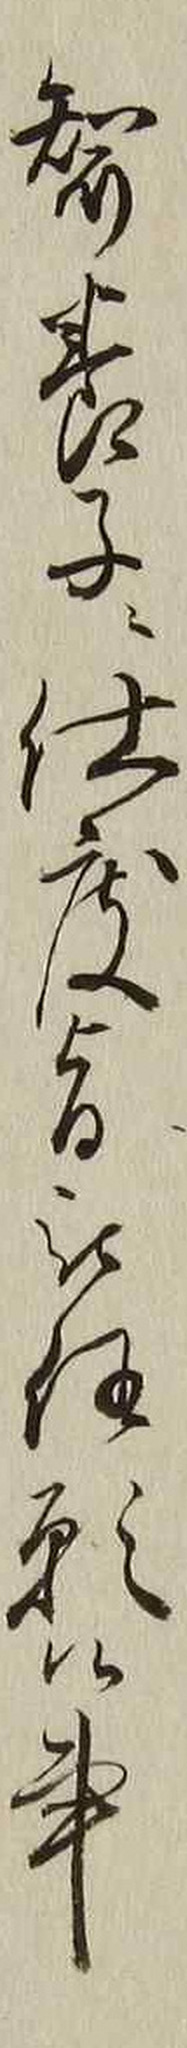聟養子ニ仕度旨被任願候事
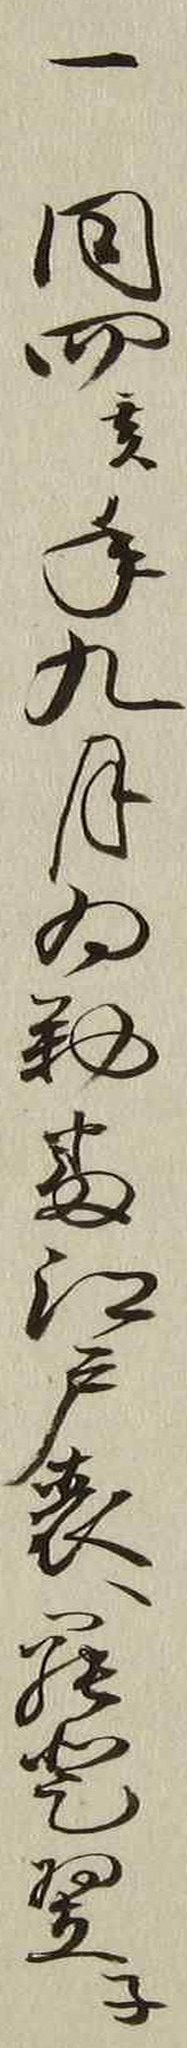一同四亥年九月為勤番江戸表へ罷登翌子
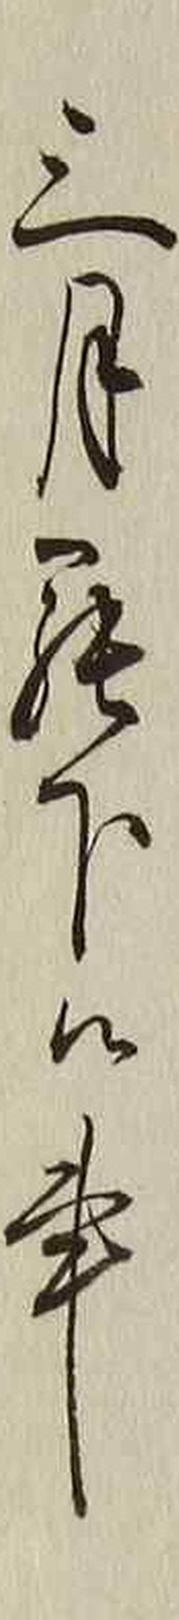三月罷下候事
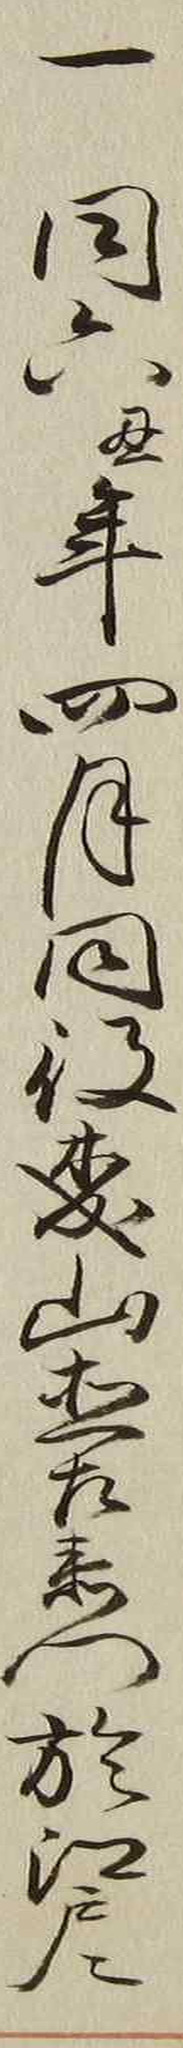一同六丑年四月同役森山直左衛門於江戸ニ
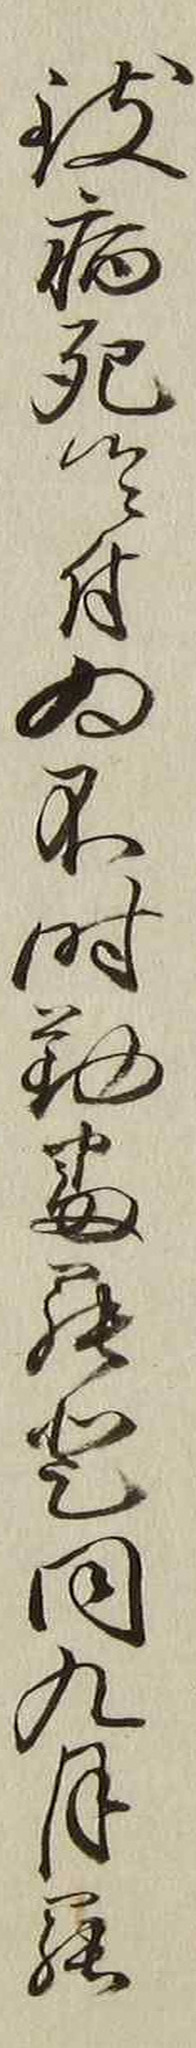致病死候ニ付為不時勤番罷登同九月罷
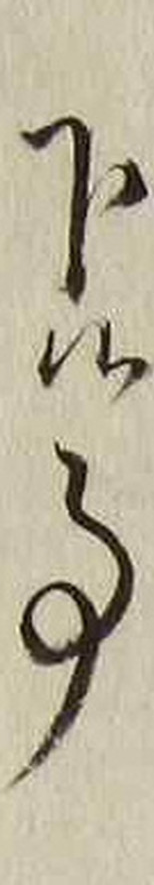下候事
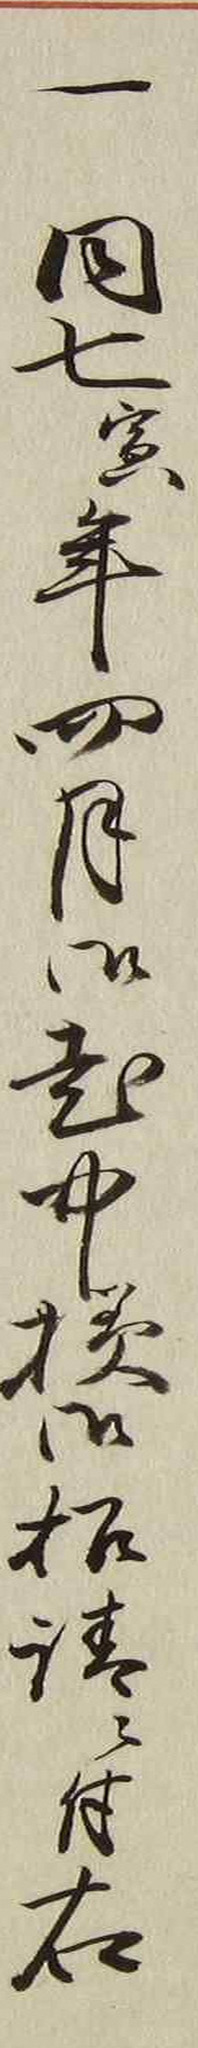一同七寅年四月御老中様御招請ニ付右
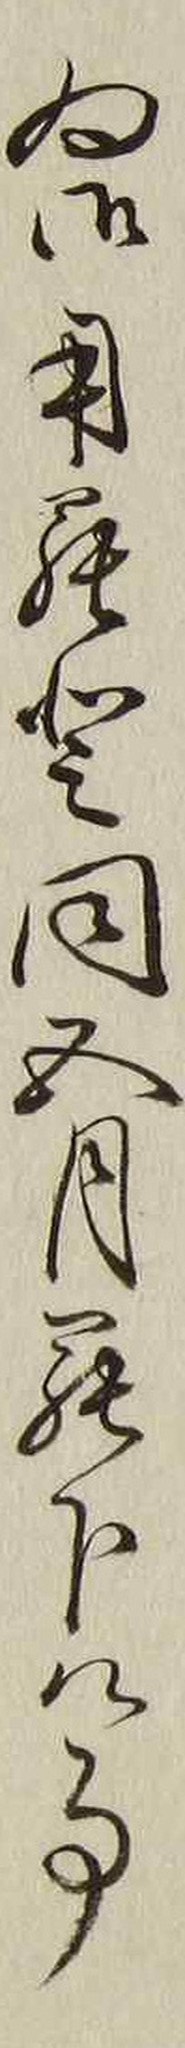為御用罷登同五月罷下候事
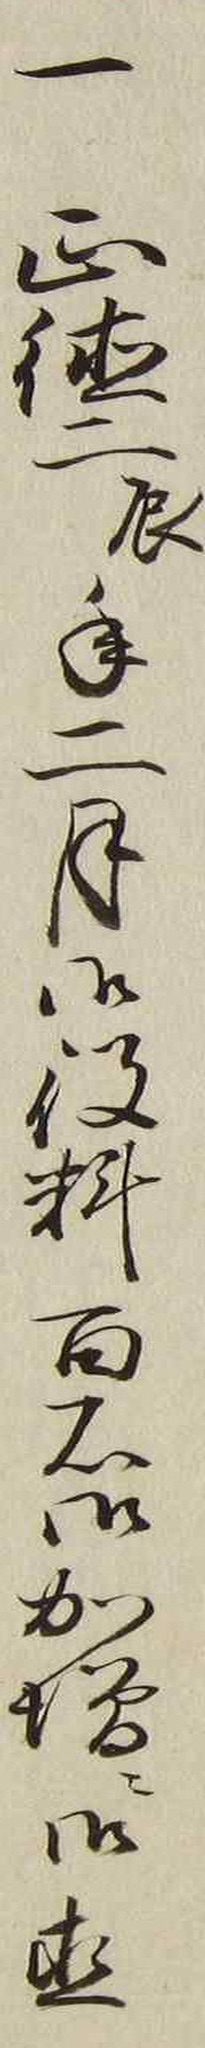一正徳二辰年二月御役料百石御加増ニ御直
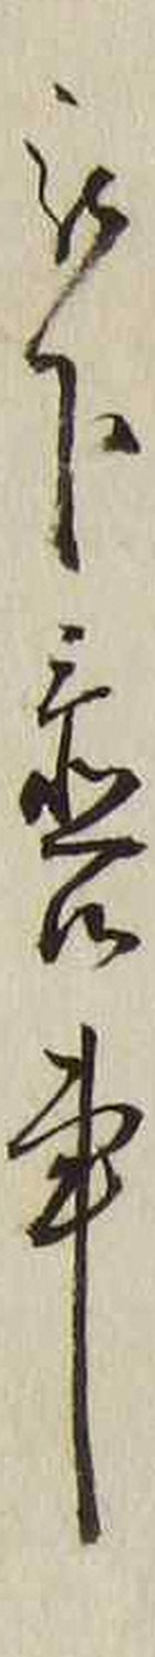被下置候事
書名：諸士系譜　巻之21　い之部21
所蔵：会津若松市立会津図書館
